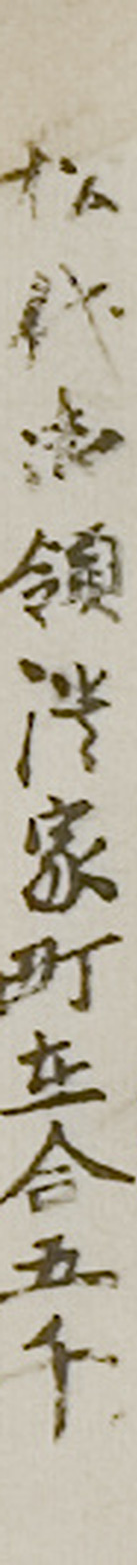松代御領潰家町在合五千
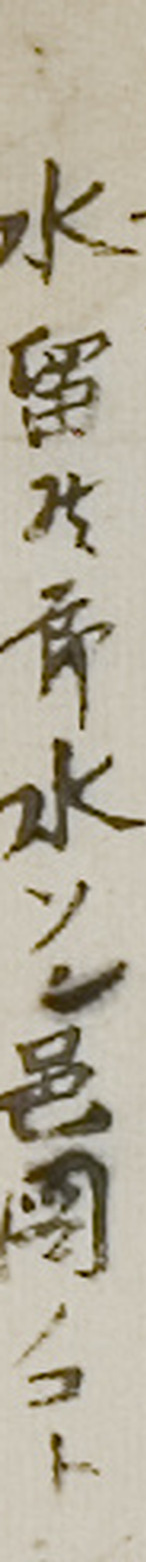水留候節水ソン邑図ノコトシ
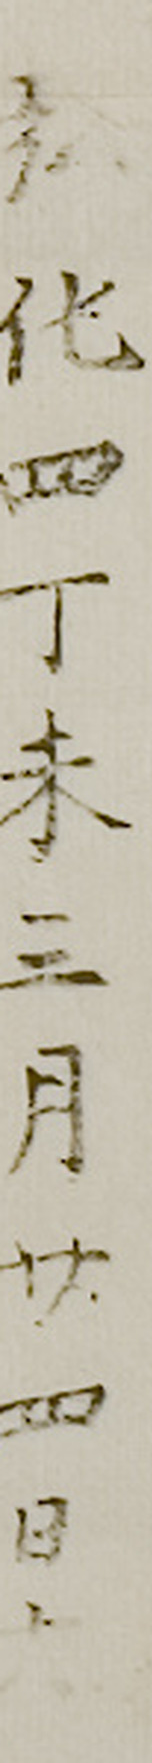弘化四丁未三月廿四日大
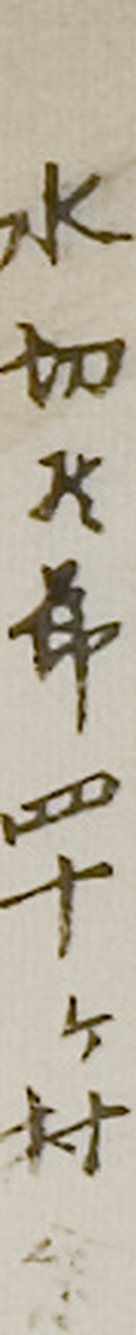水切候節四十ヶ村
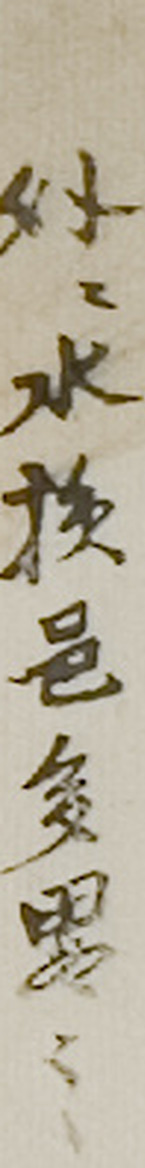外ニ水損邑多略之
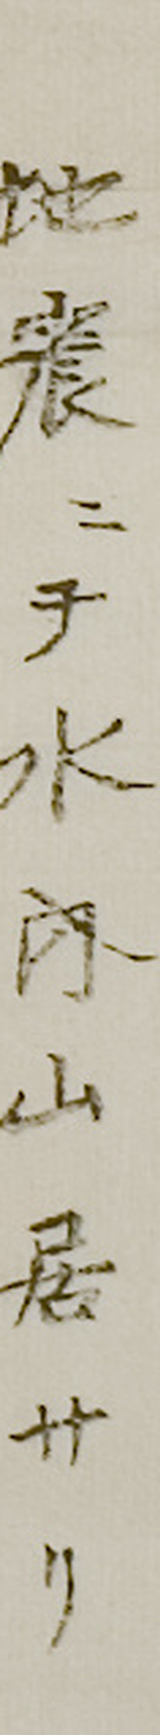地震ニテ水内山居サリ
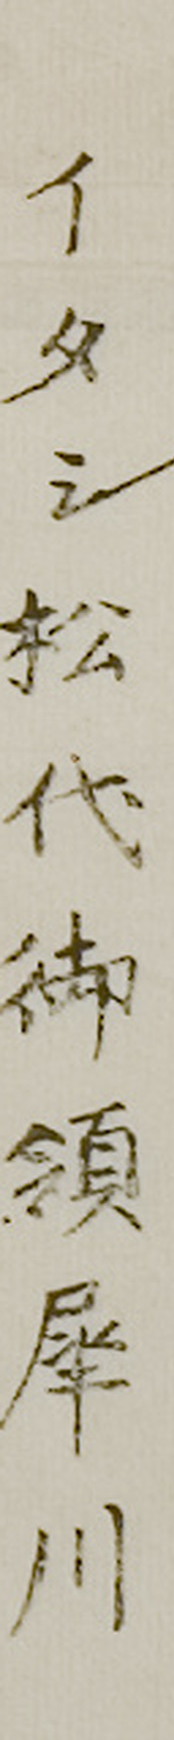イタシ松代御領犀川
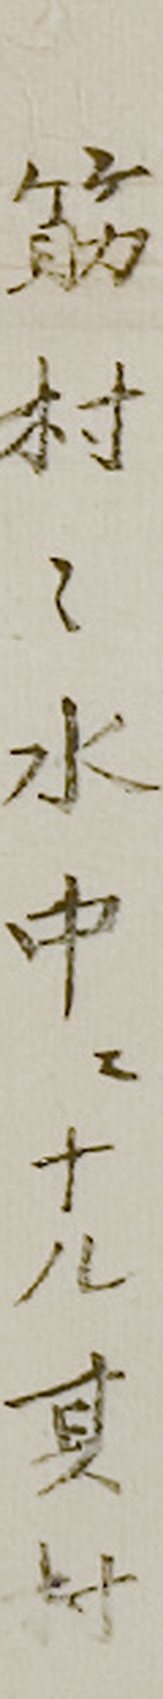筋村々水中ニナル其村
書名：[弘化四年丁未三月二十四日松代御領犀川筋地震]
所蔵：東京大学総合図書館 General Library in the University of Tokyo, JAPAN
